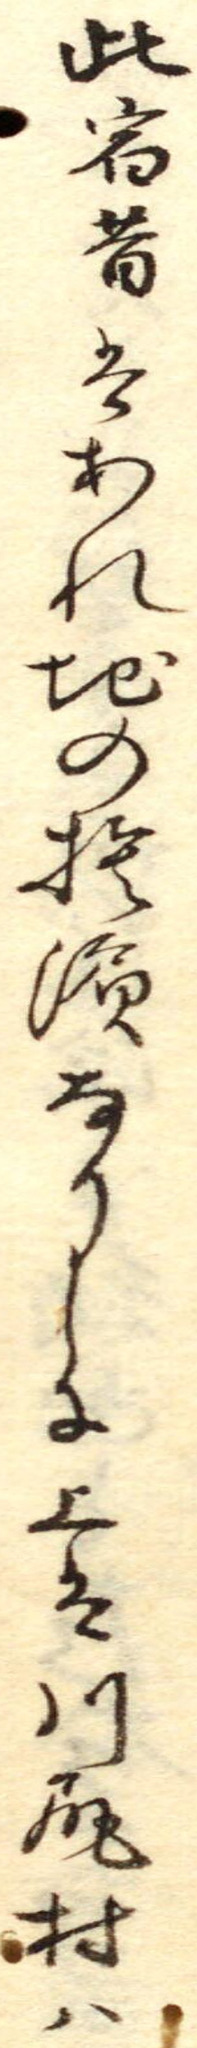此宿昔はあれ地の捨浜なりしに上は川尻村は
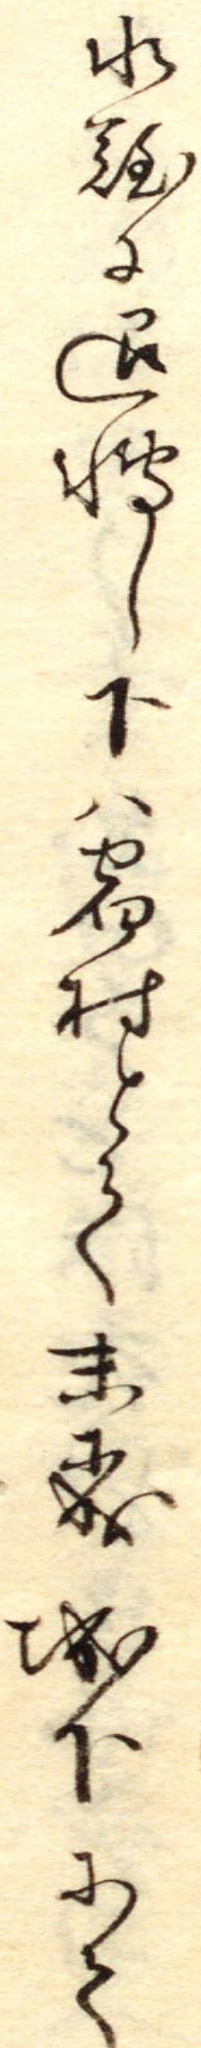水難に退転し下は宿村とて末森城下にて
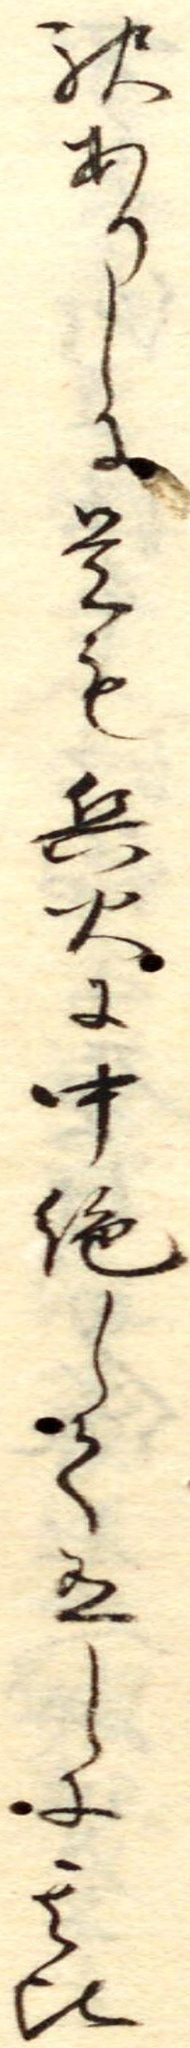駅ありしに是も兵火に中絶して有しに其比
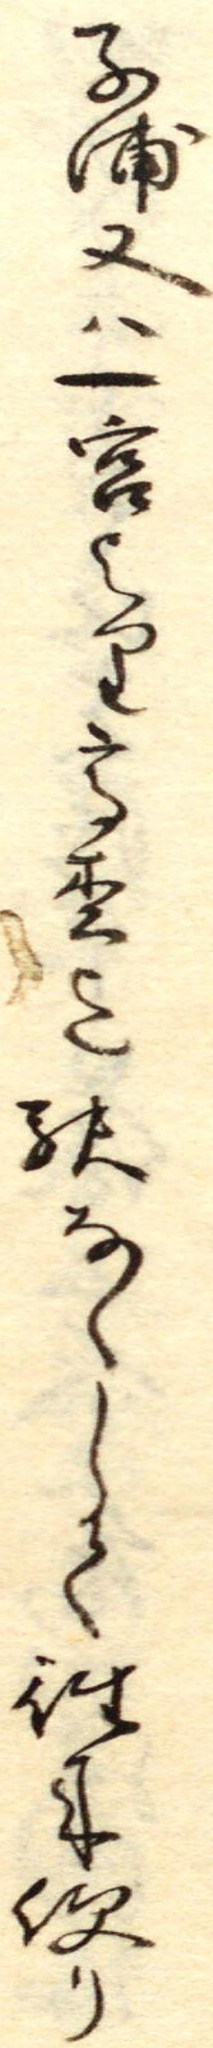子浦又は一宮より高枩迄駅なくして往来便り
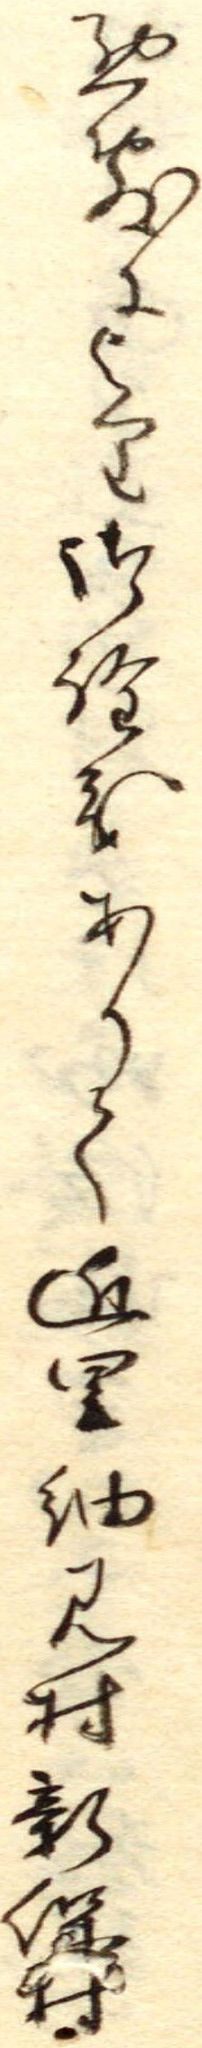悪敷により御詮議ありて近里紬見村新保村
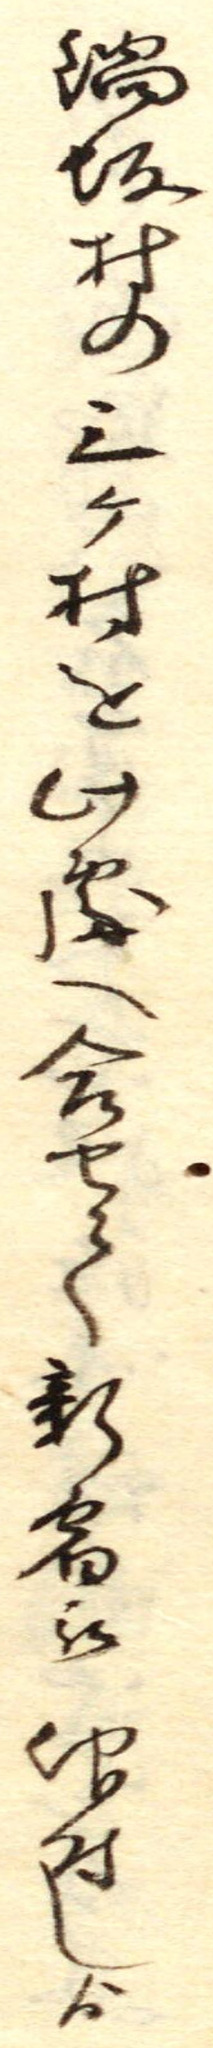鍋坂村の三ヶ村を此処に合せて新宿被仰付しゟ
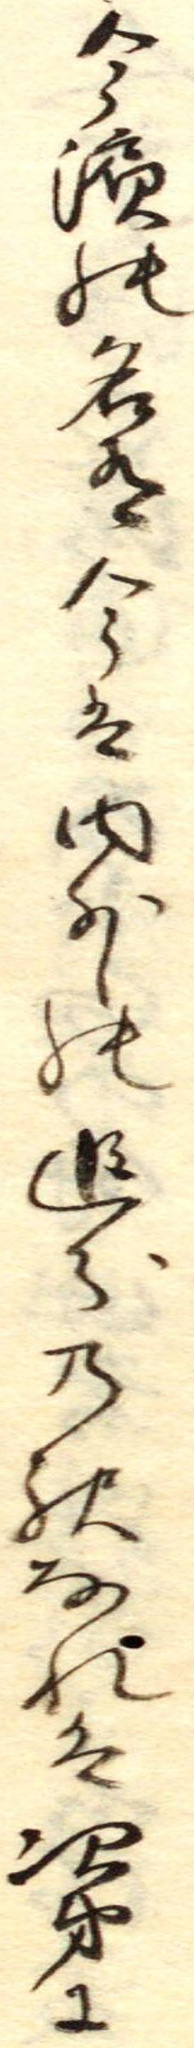今濱の名有今は内外の追分の駅なれは次第に
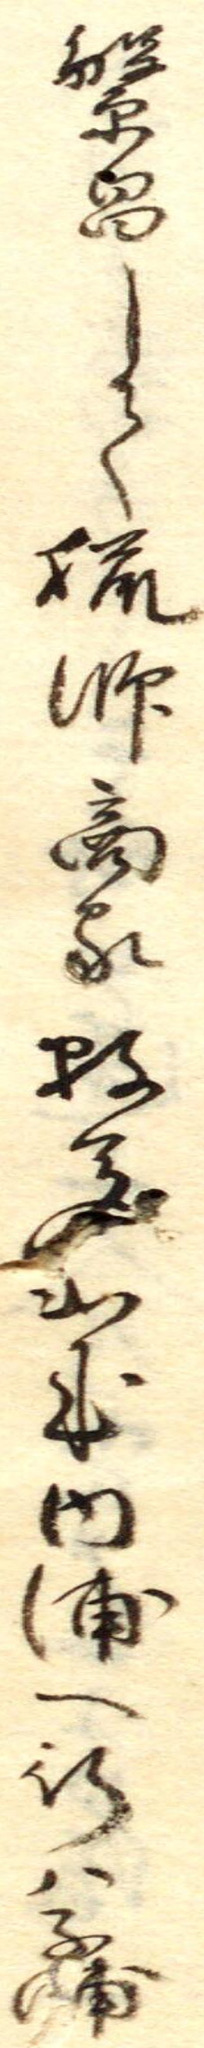繁昌して猟師商家数多出来内浦へ行は子浦
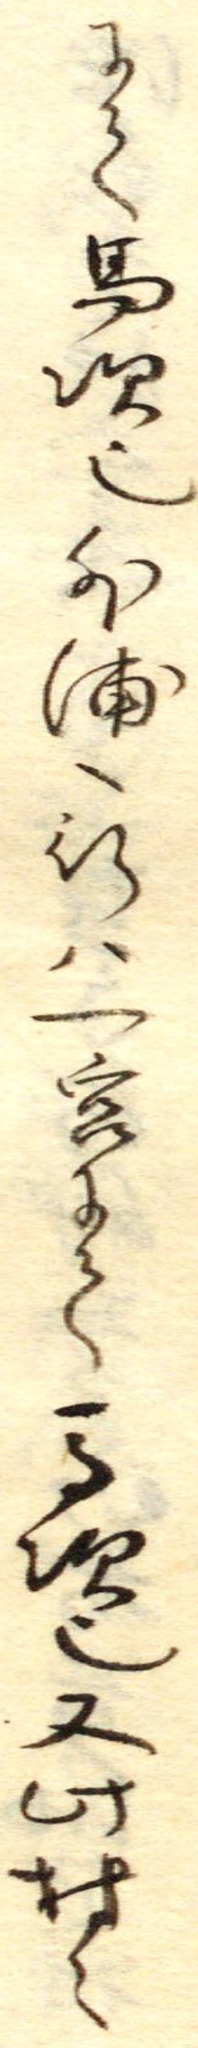にて馬次也外浦へ行く一宮にて馬次也又此村之

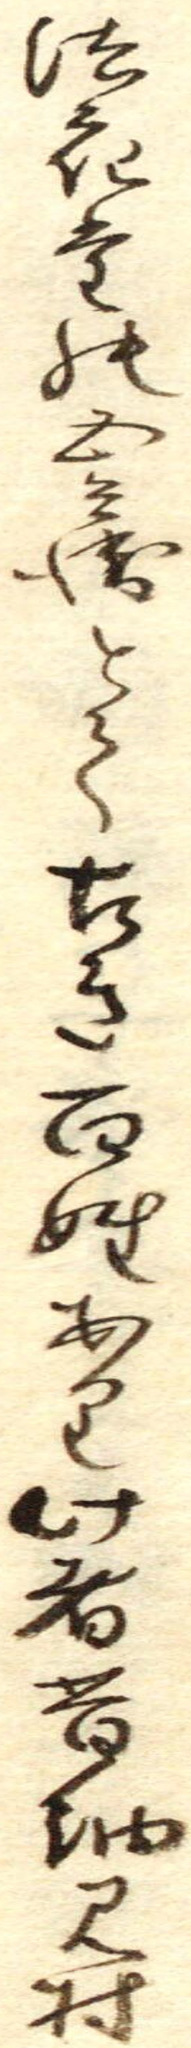法花堂の五兵衛とて古き百姓あり此者昔油見村
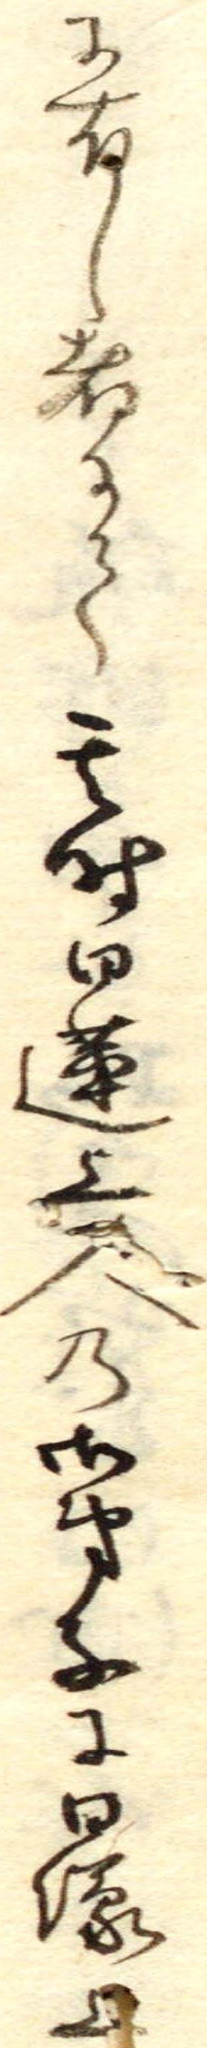に有し者にて其時日蓮上人の御弟子に日像上
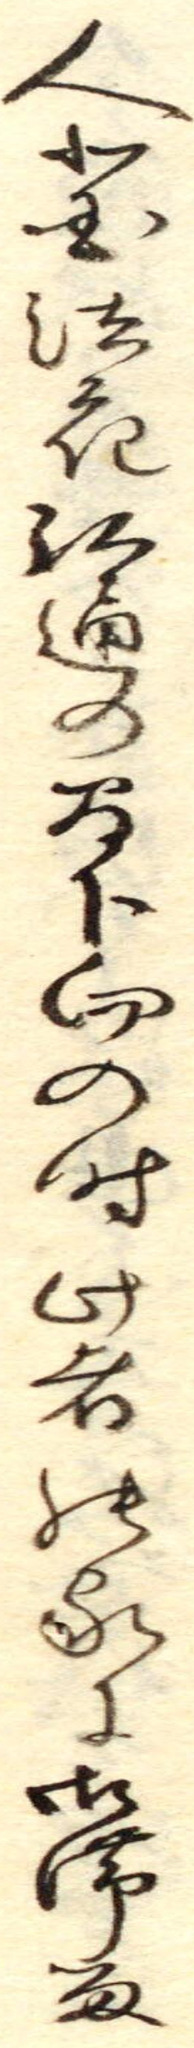人北国法花弘通の間下向の時此者の家に御滞留
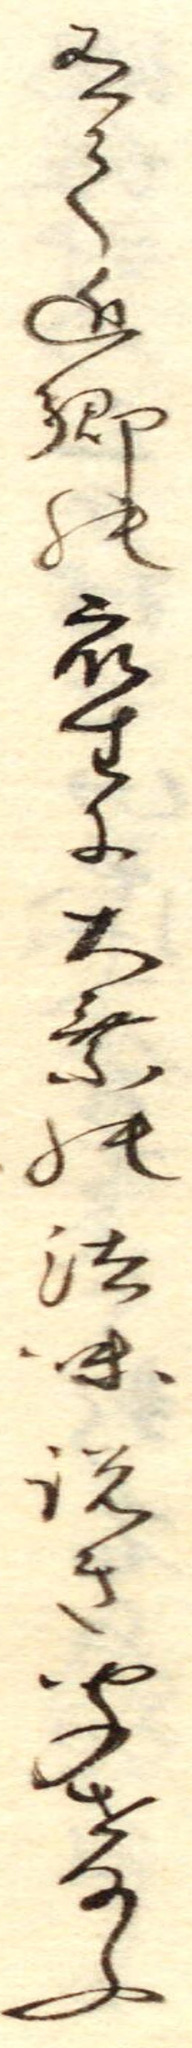有て近郷の衆生に大乗の法味説き聞せ給ふ
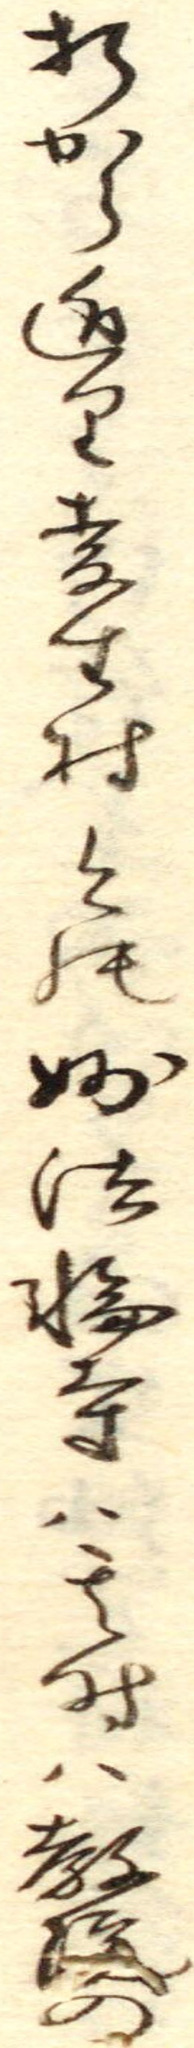折から近里麦生村今の妙法輪寺は其時は教院の
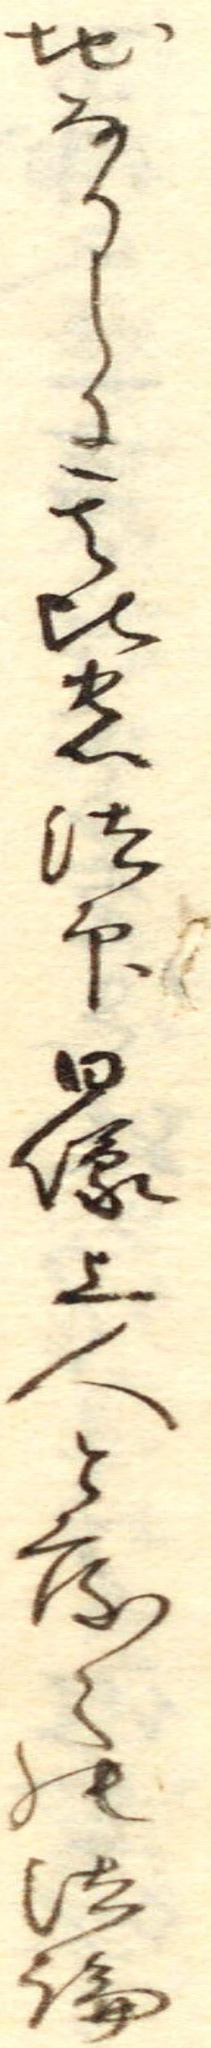地なりしに其比の法印日像上人と度々の法論
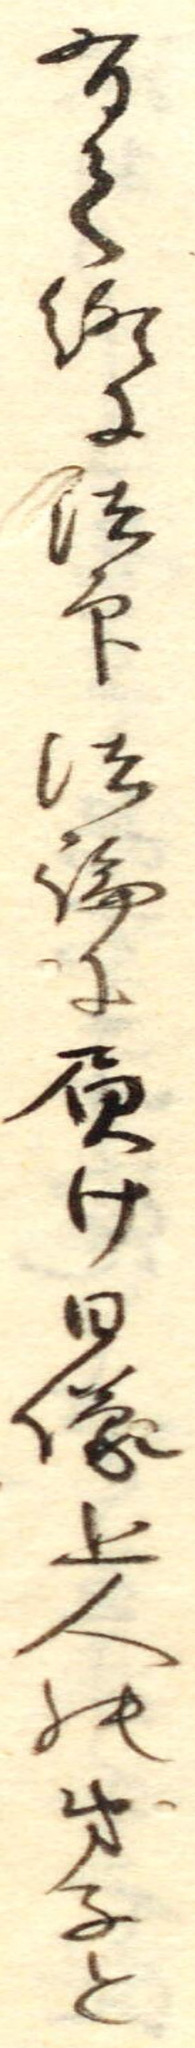有て終に法印法論に負け日像上人の弟子と
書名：能登名跡誌
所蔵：Ishikawa Prefectural Library
